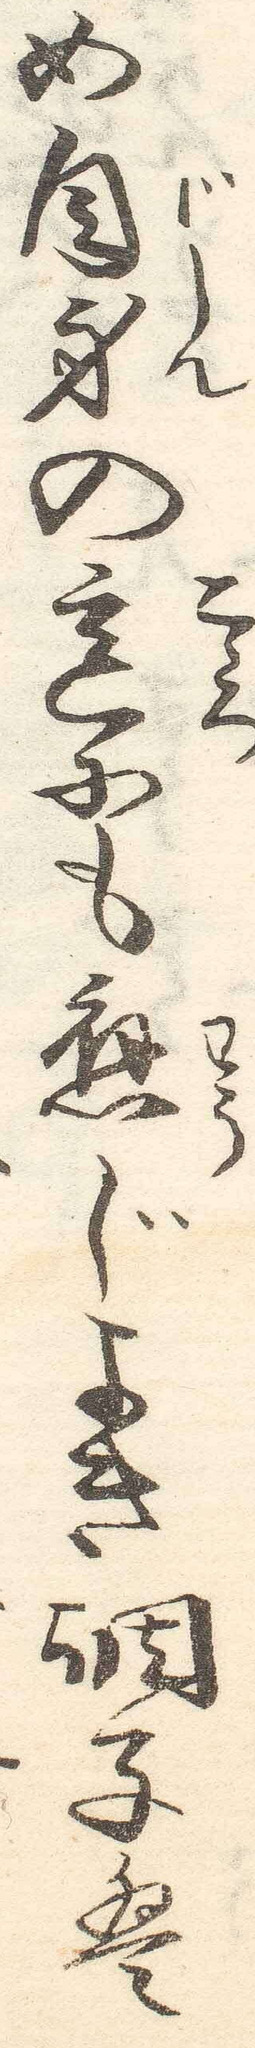め自身の意にも応じよき調子は
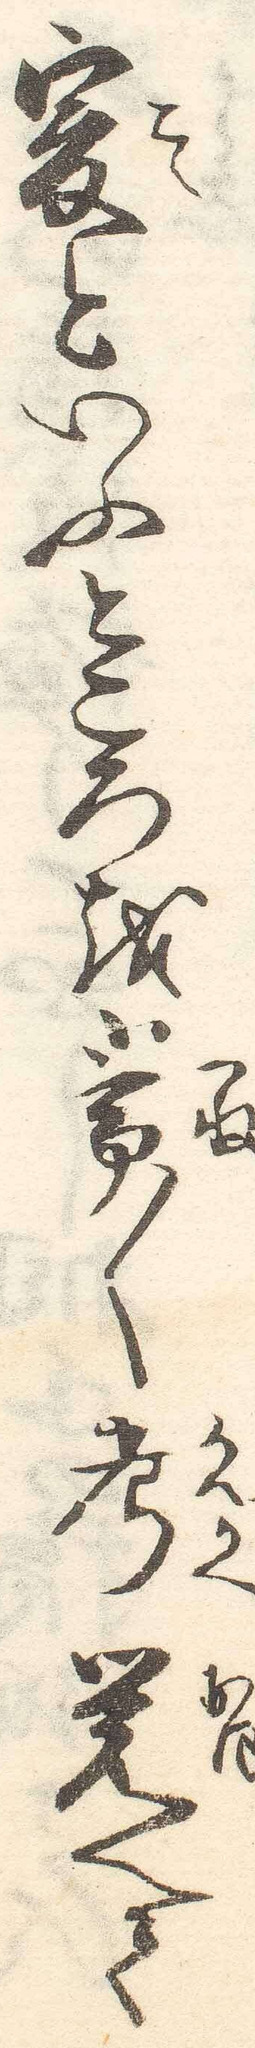爰といふところを常〳〵考覚へて
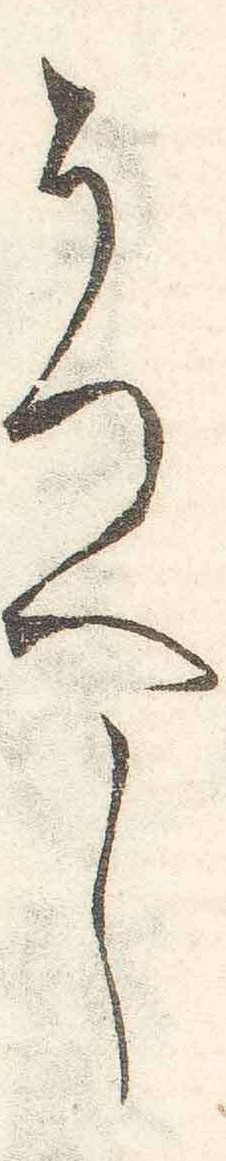うつへし
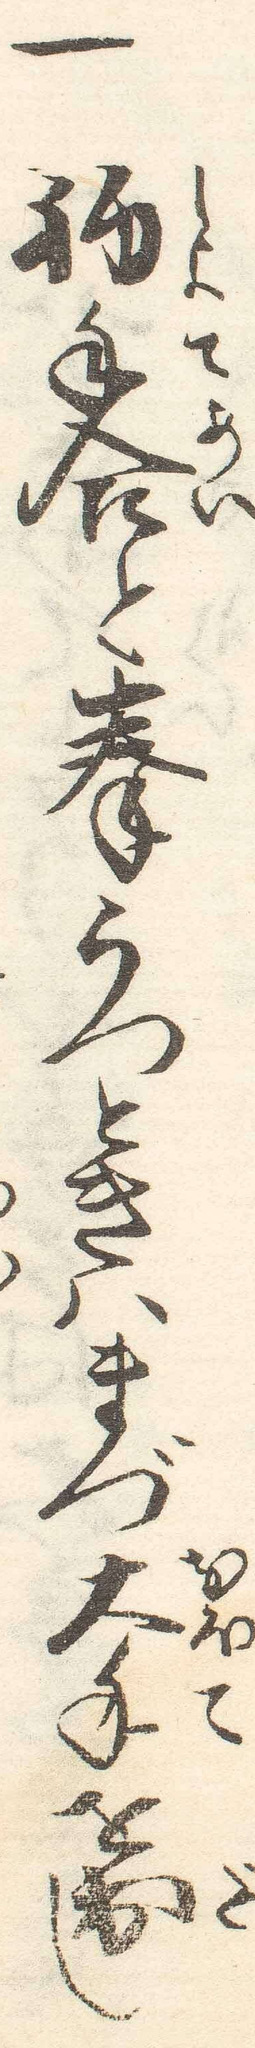一初手合と拳うつときはまづ大手を出し
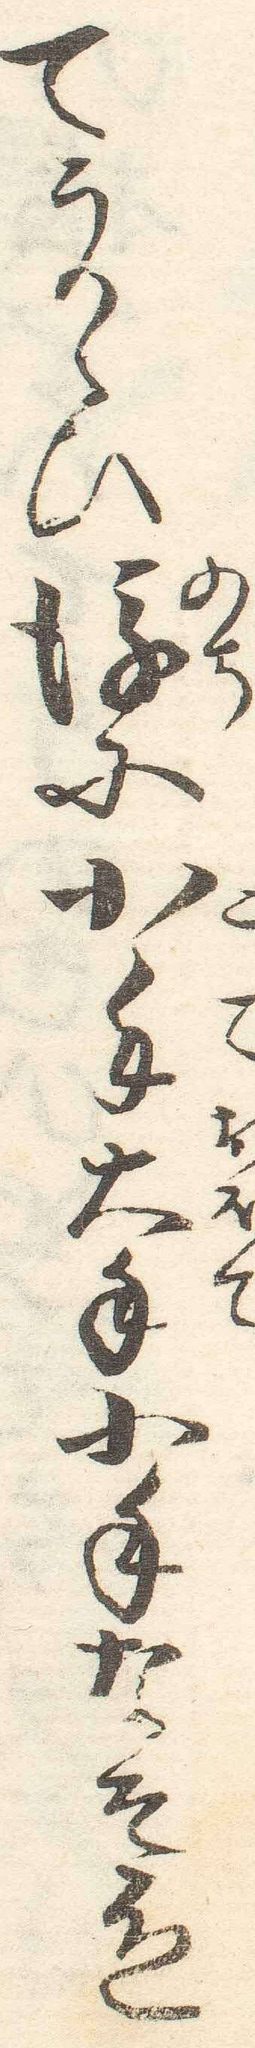てうかゝひ後に小手大手小手なぞ色
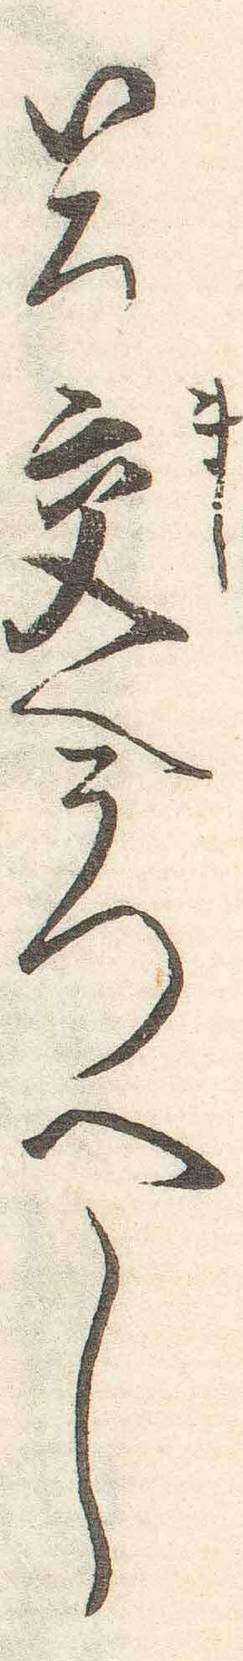いろ交へうつへし

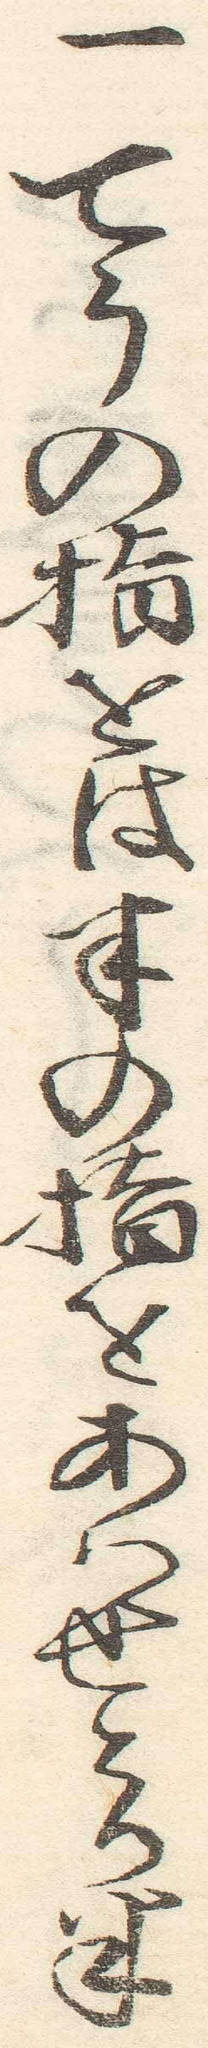一てうの指をは半の指をあはせとり半
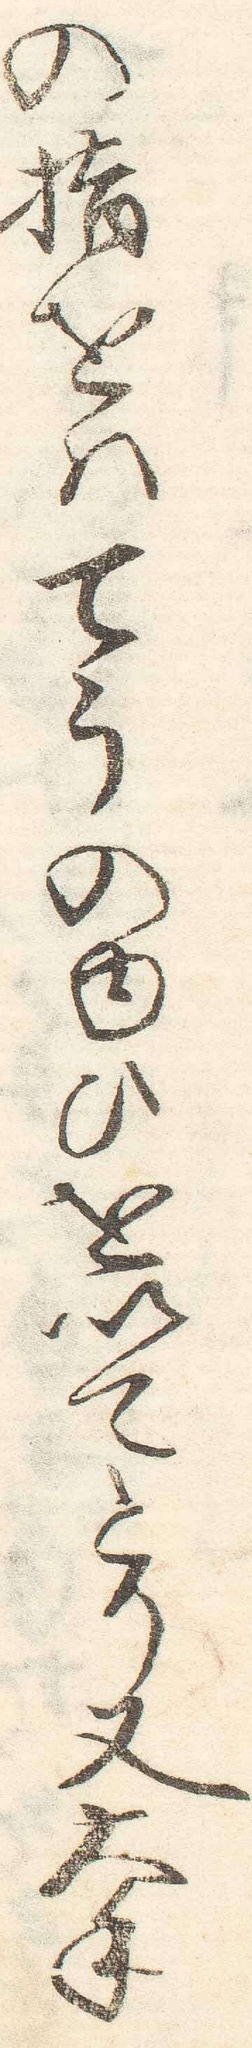の指をはてうのゆひを以てとり又大手
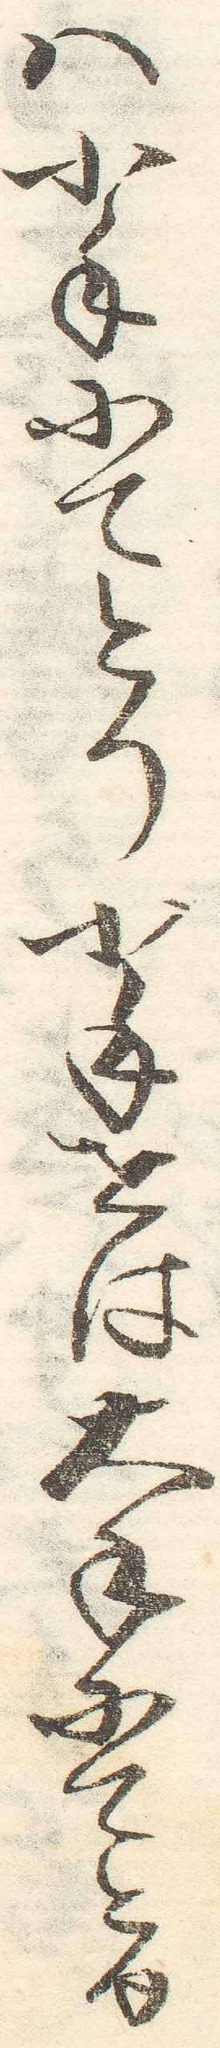は小手にてとり小手をは大手にてとる
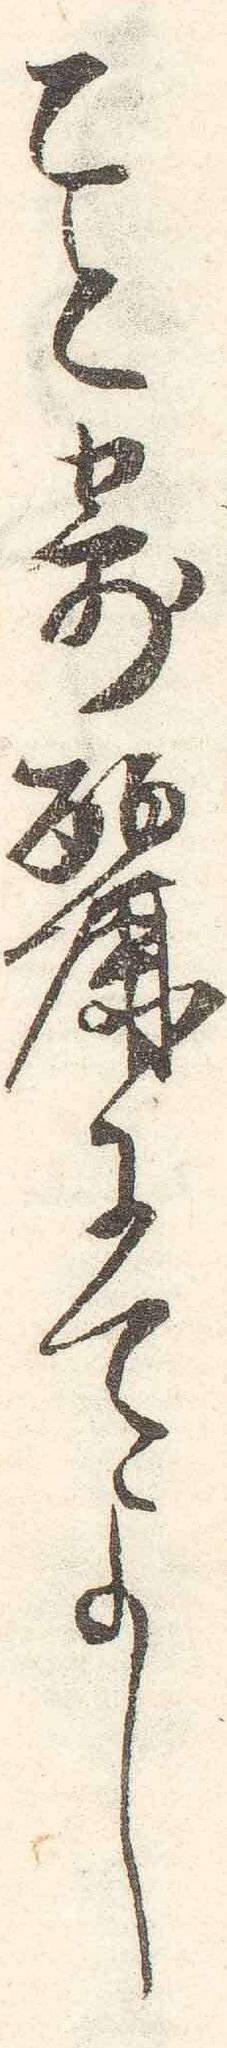こと綺麗にてよし
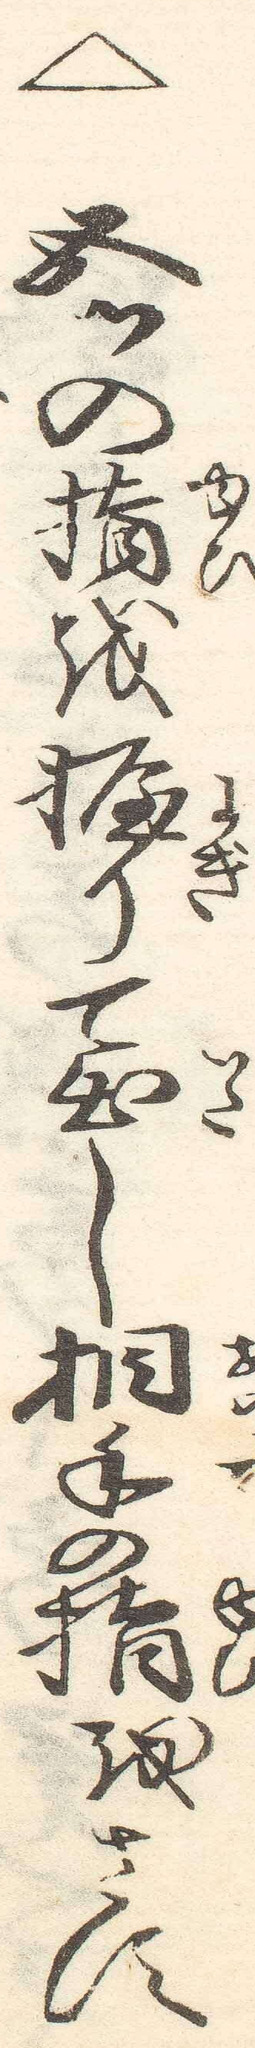△五ッの指を握りて出し相手の指をさす
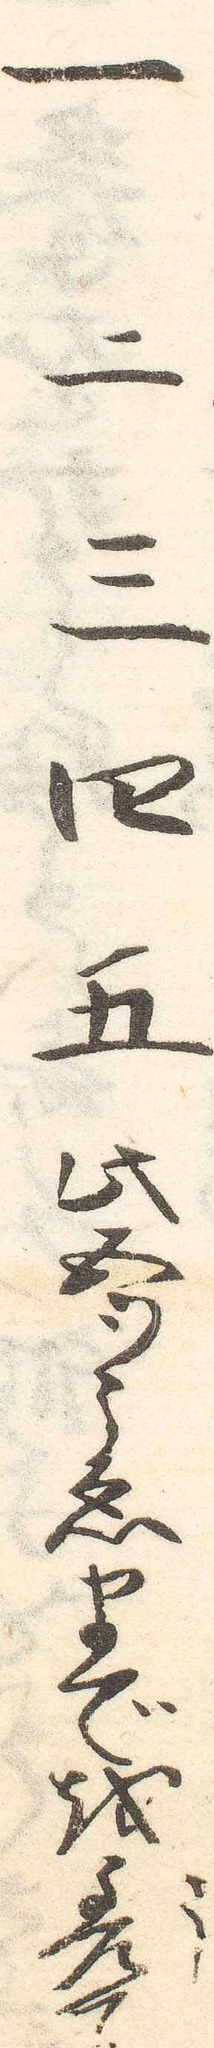一二三四五此五ッこゑまでを差て
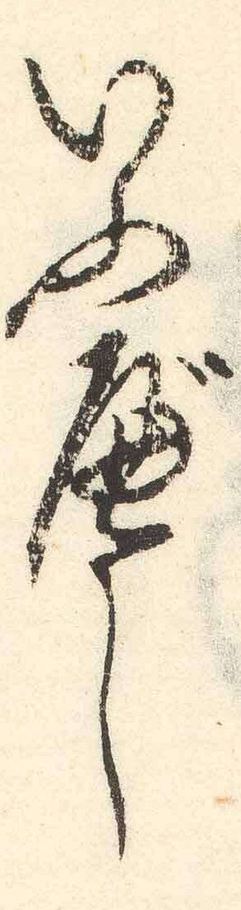いふべし
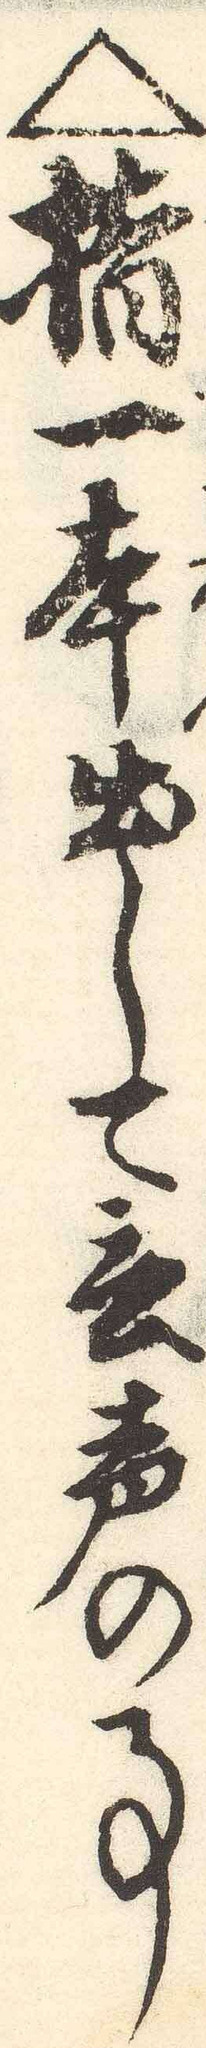△指一本出して云声の事
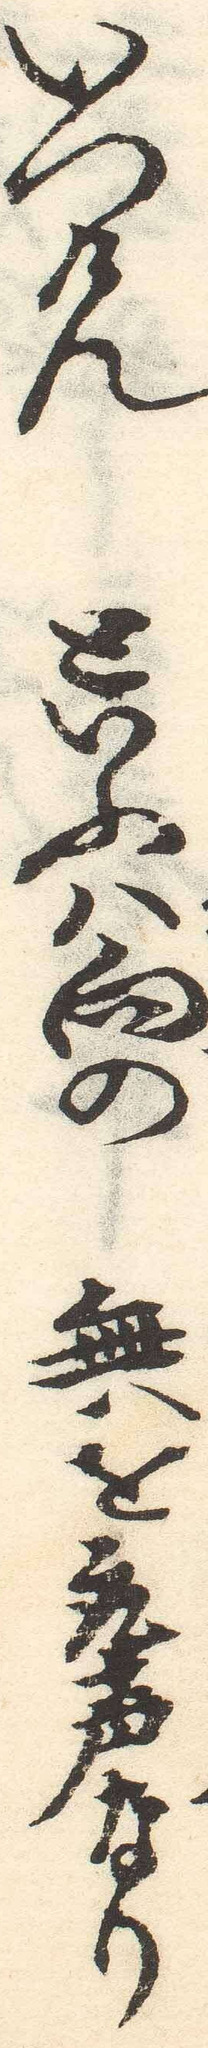いつけんといふは向の無を取声なり
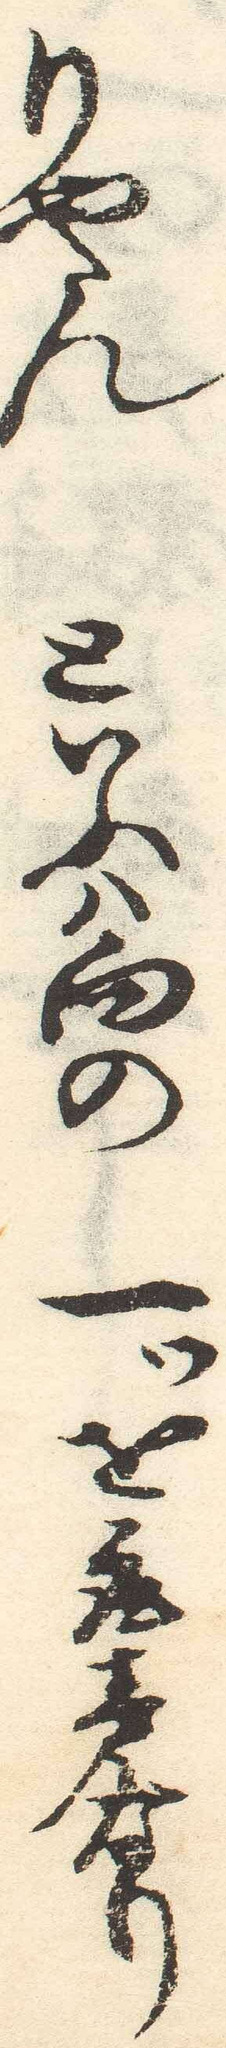りやんといふは向の一ッを取声なり
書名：拳独稽古
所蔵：東京学芸大学附属図書館 国文学研究資料館
